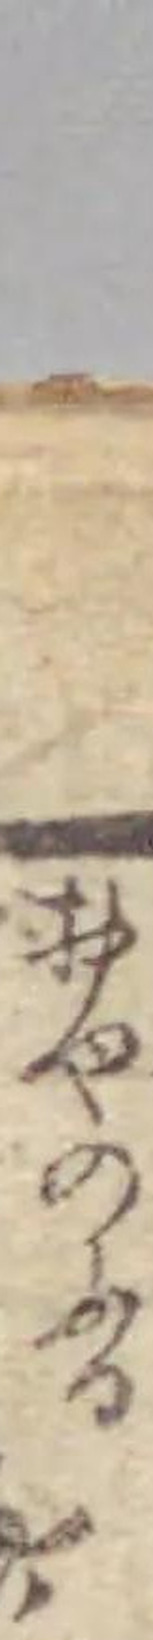おやのふる
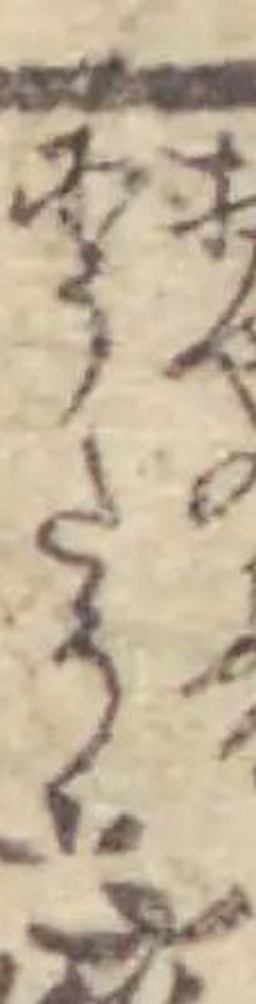にうだう
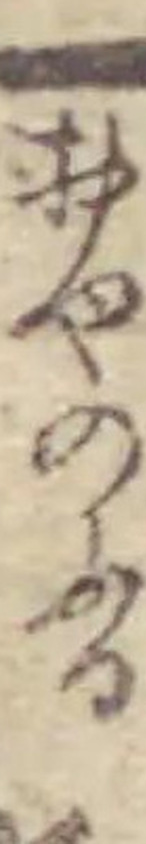おやのふる
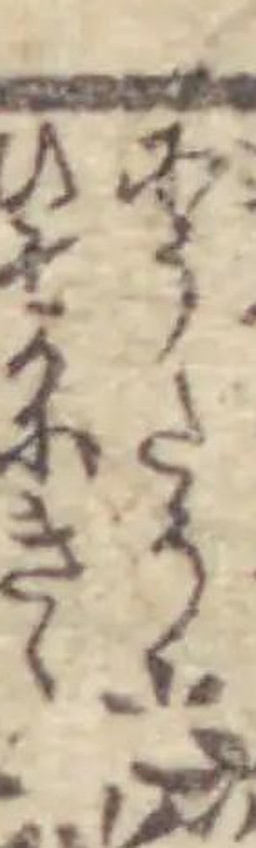ひそかにきゝ
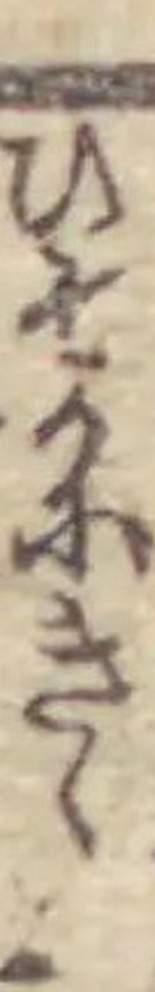ひそかにきゝ
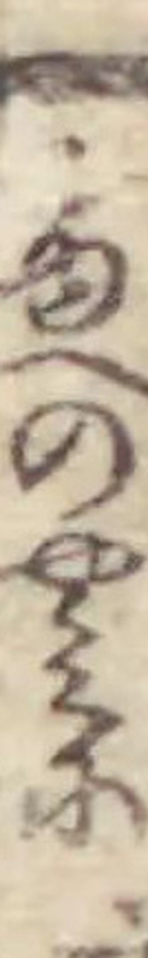ゆへのやみに
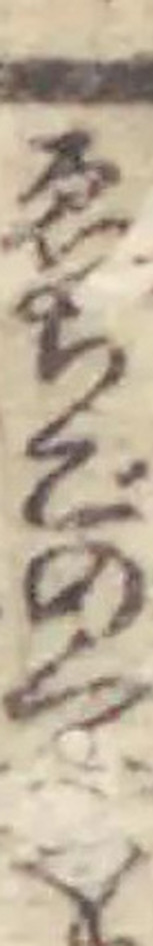ゑちごのくを
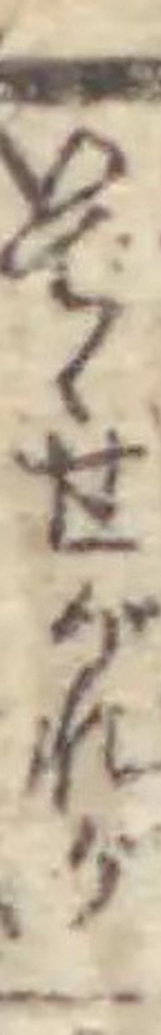いでゝせがれが
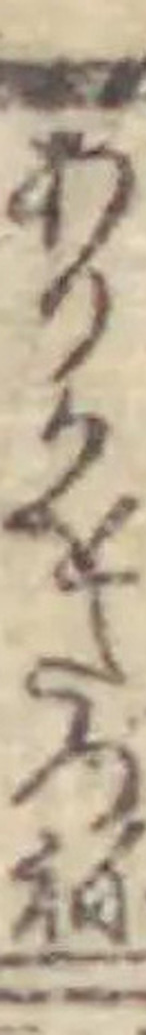ありかをたづね
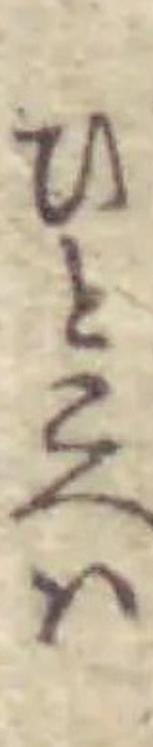ひとこへは
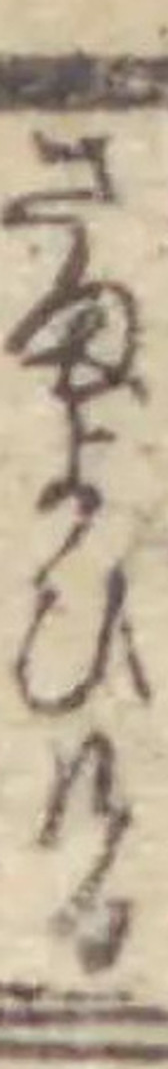さまよひける
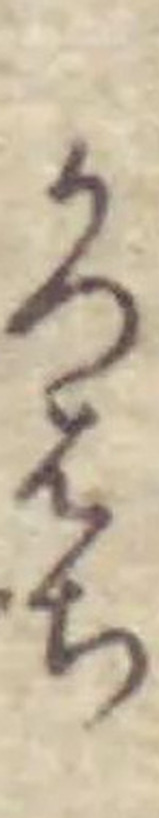かつはち
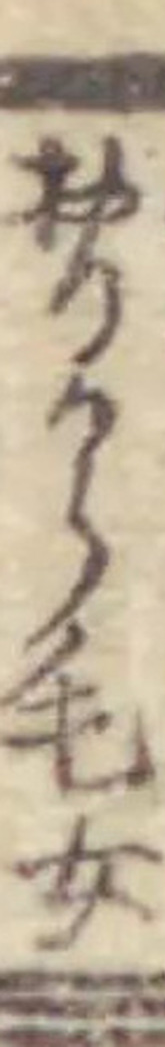おりから毛女
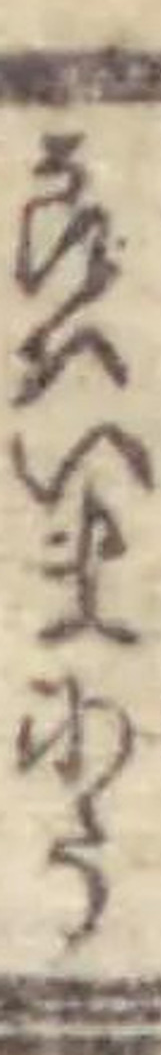郎はいまにう
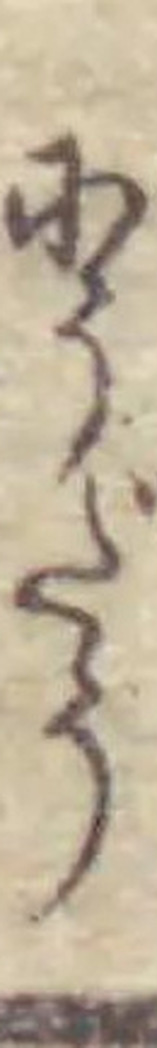にうだう
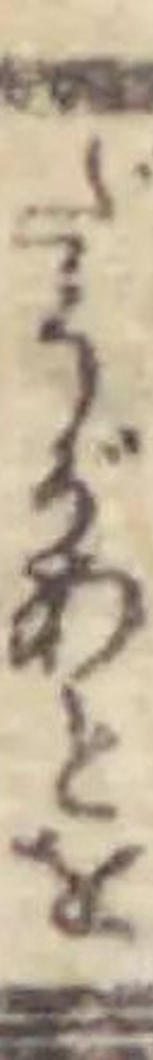だうがあとを
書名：大昔化物双紙 2巻
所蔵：国立国会図書館 National Diet Library, JAPAN
